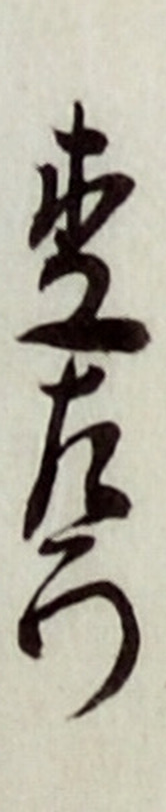杢左衛門

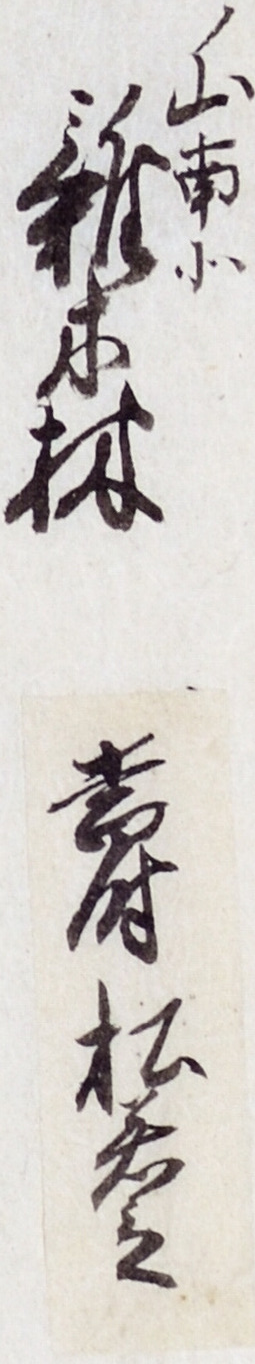雑木林当時松若立
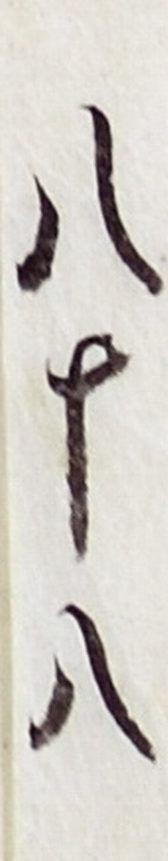八十八
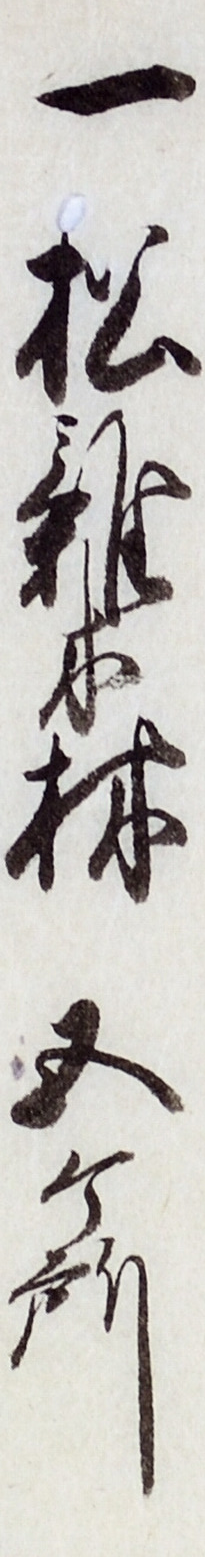一松雑木林五ヶ所
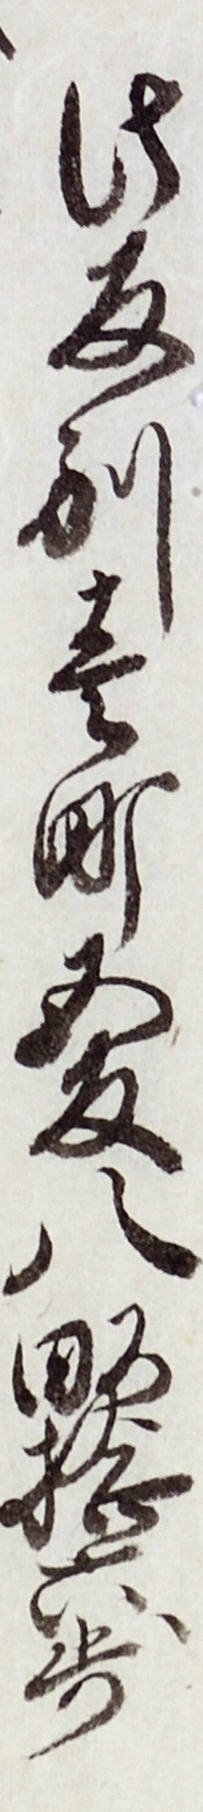此反別壱町五反八畝拾六歩
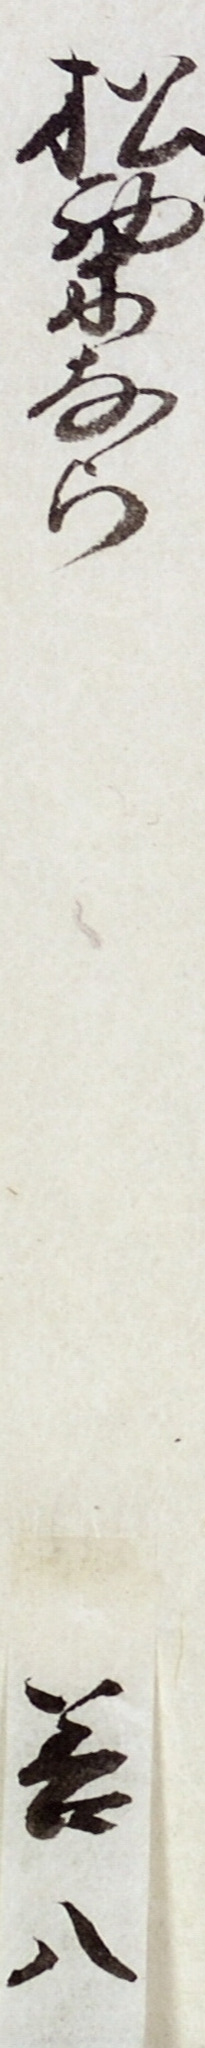松栗なら若八
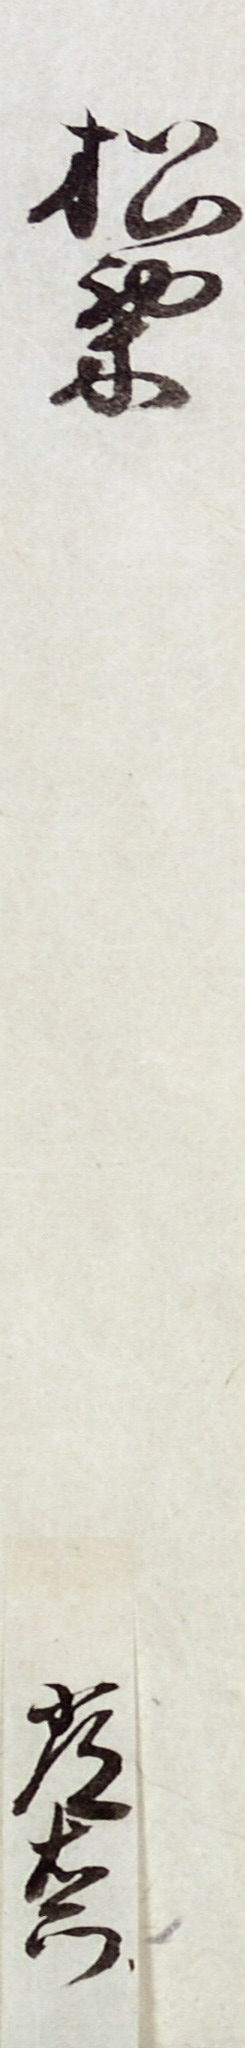松栗常右衛門

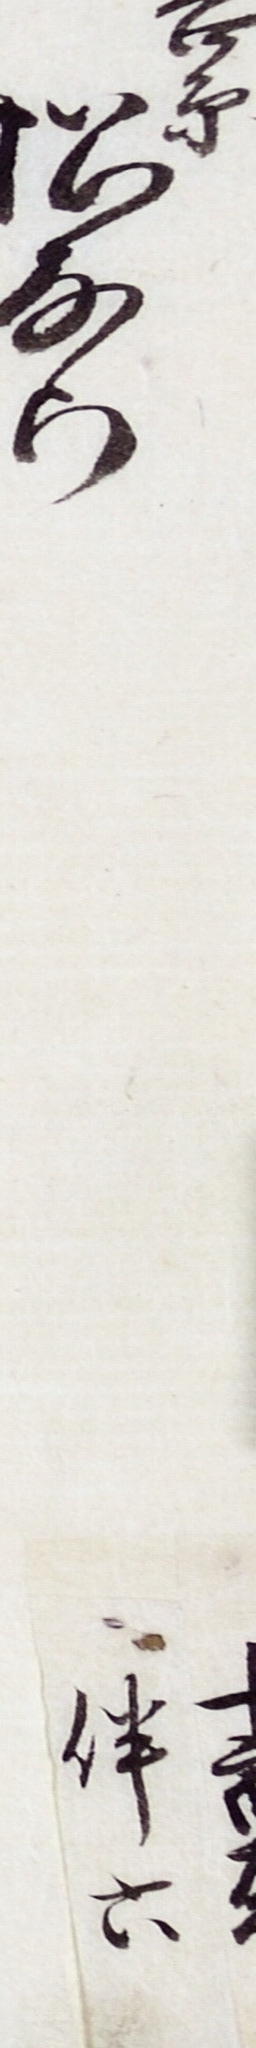松なら伴六
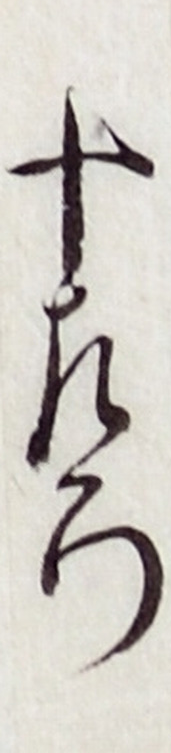十左衛門
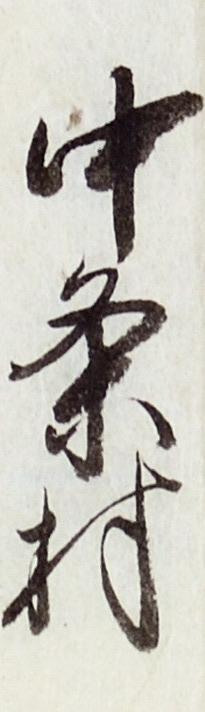中条村
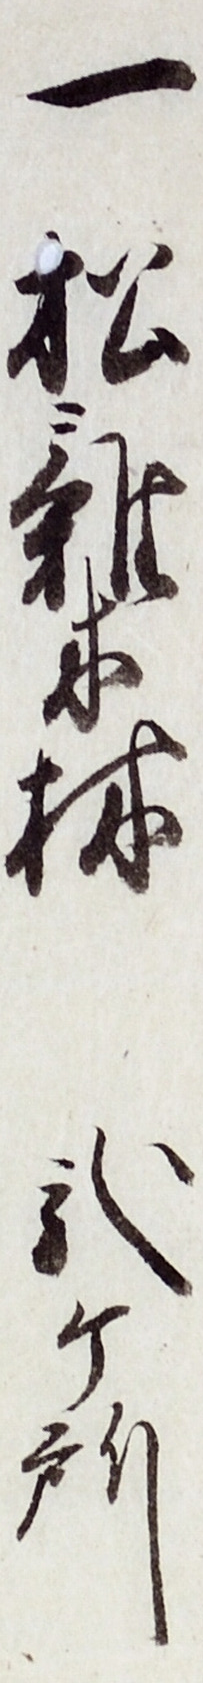一松雑木林弐ケ所
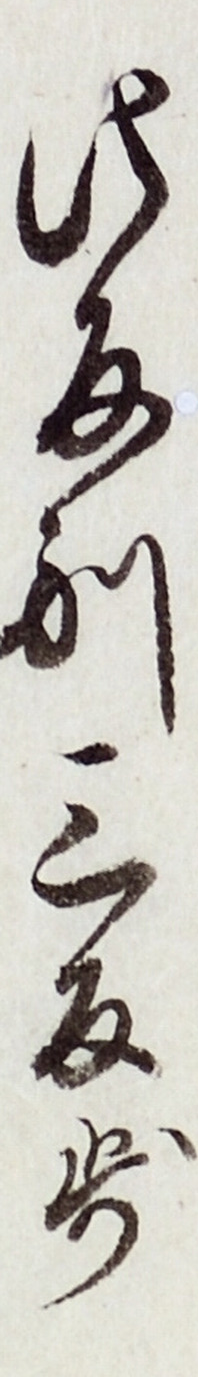此反別三反歩
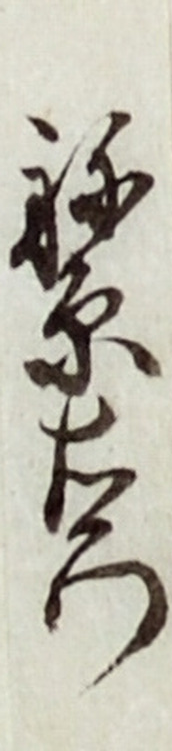同友右衛門
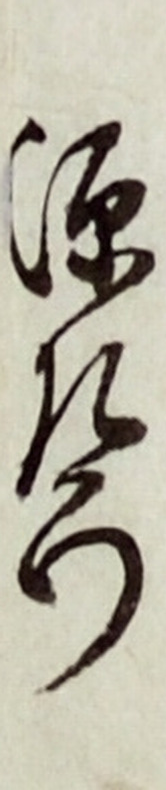源左衛門
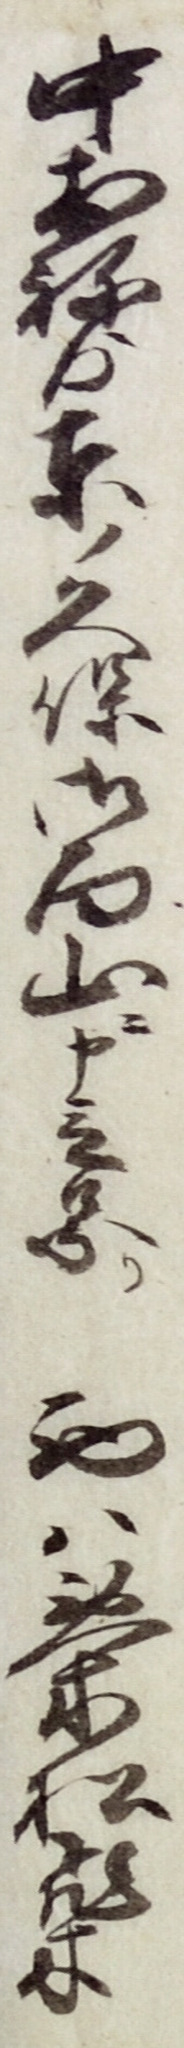中村様ゟ東ノ久保御百山ニ申立図西は悪木松飛木

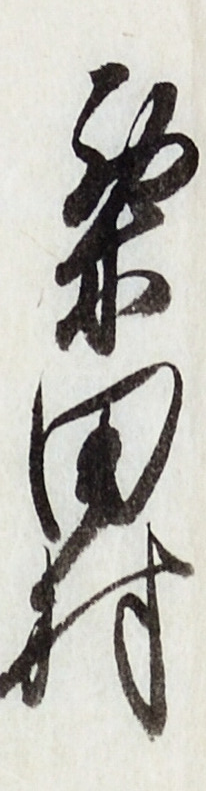栗田村
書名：御領分中御林御藪附帳
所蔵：伊那市立高遠町図書館・合同会社AMANE
